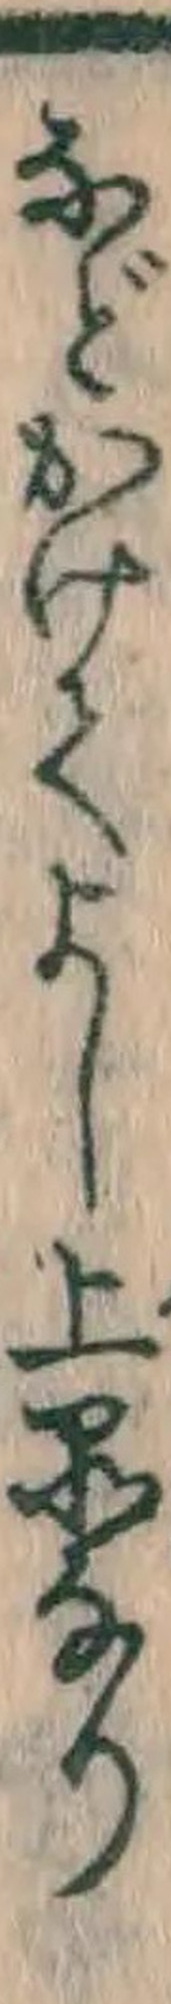などかけてよし上品なり
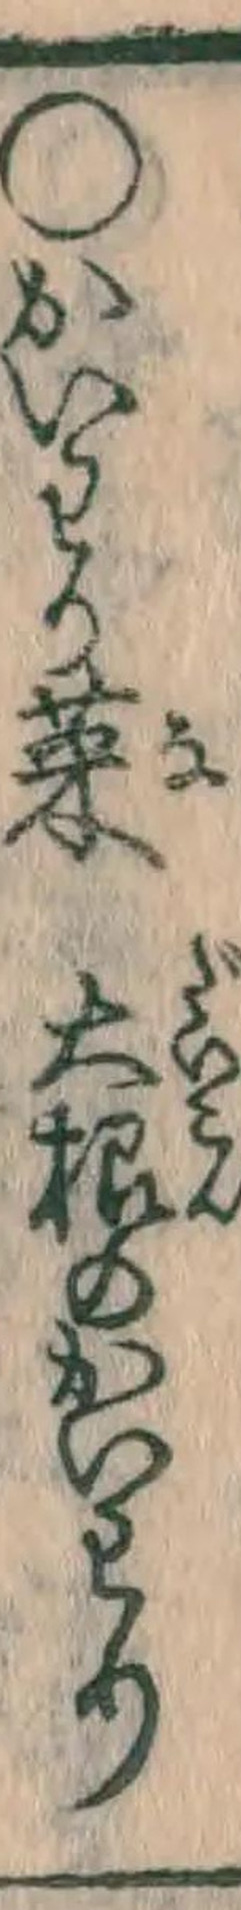○かいわり菜大根のかいわり
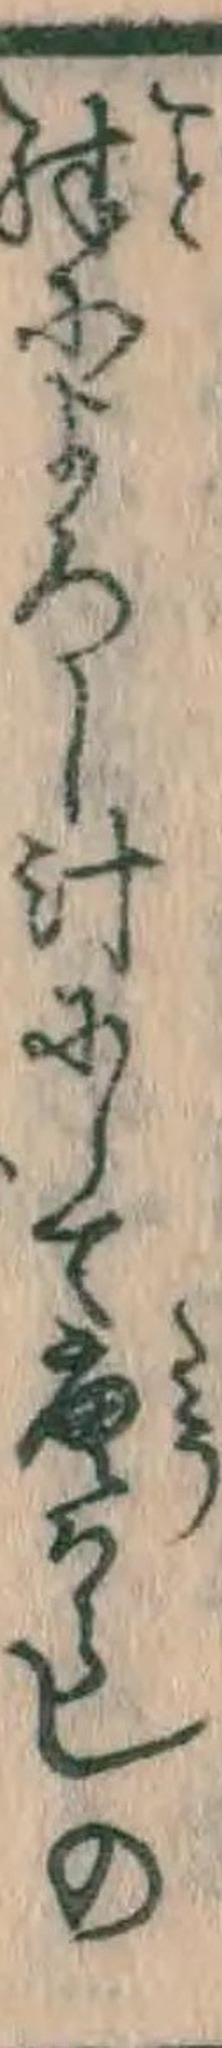殊によろし汁にして唐からしの
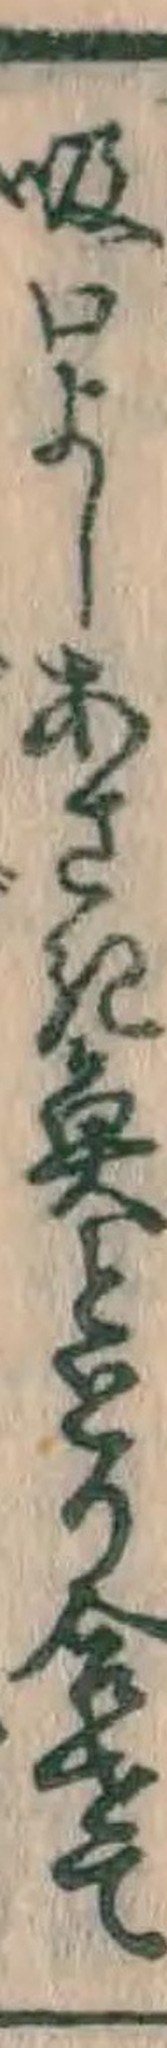吸口よしあさき魚ととり合せて
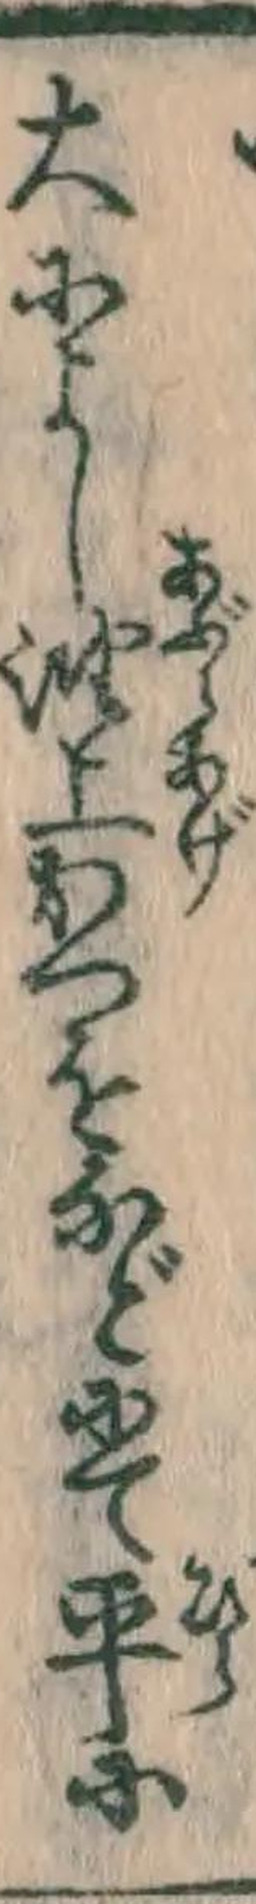大によし油上かつをなどにて平に
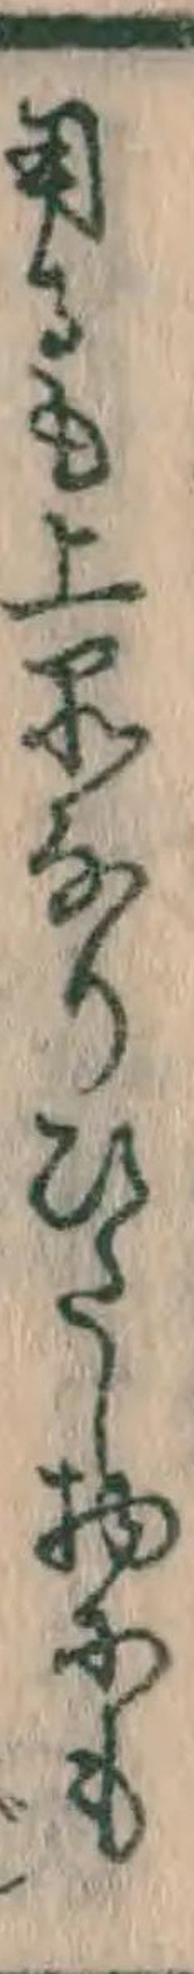用るも上品なりひたし物にも
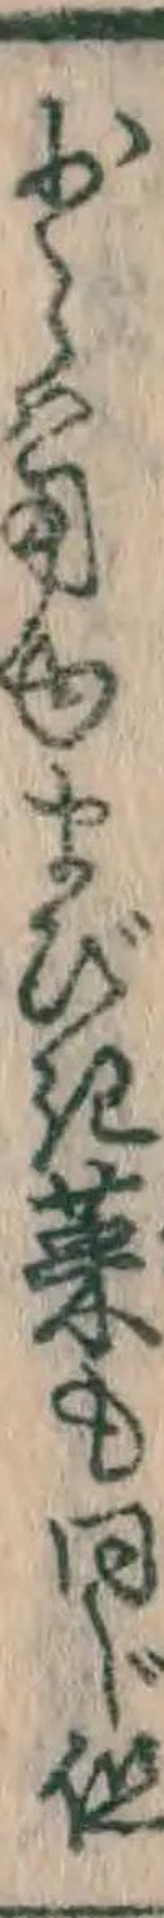少々は用ゆまびき菜も同じ但
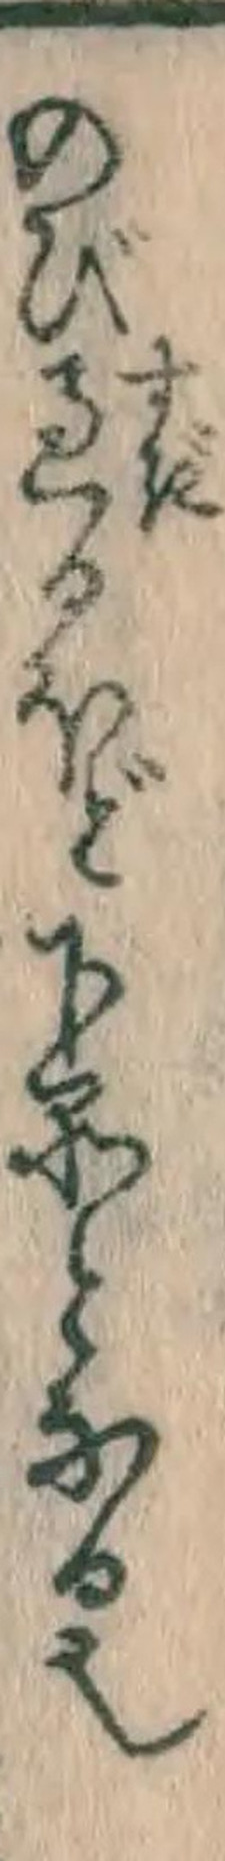のび過るほど下品となる也
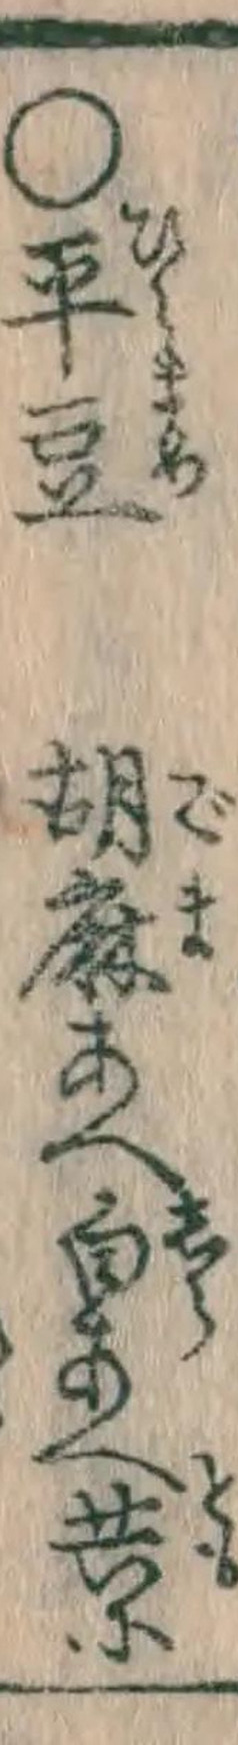○平豆胡麻あへ白あへ共に
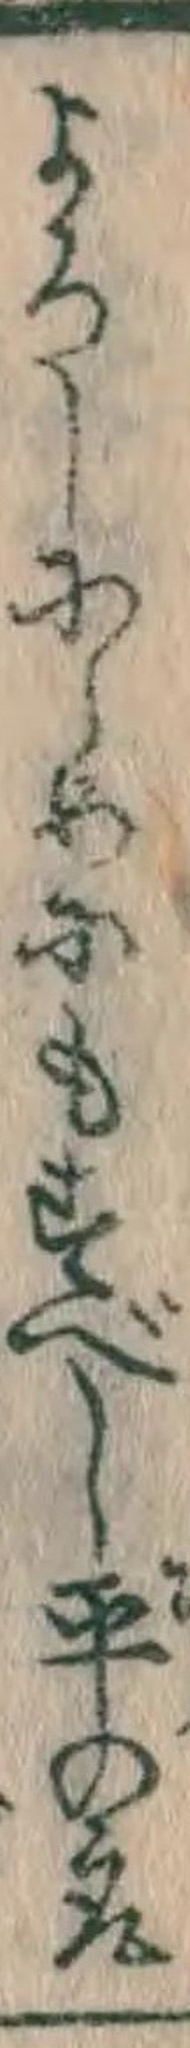よろしにしめにもすべし平の取
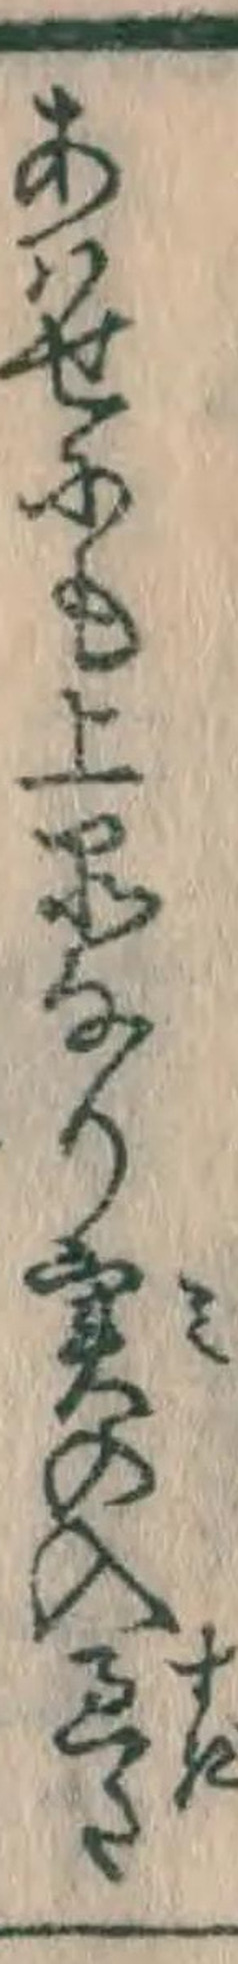あはせにも上品なり実の入過た
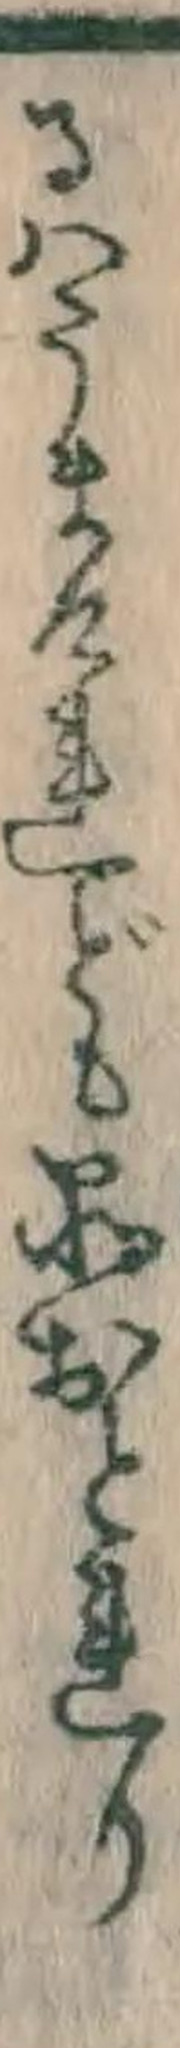るはうまけれども品おとれり
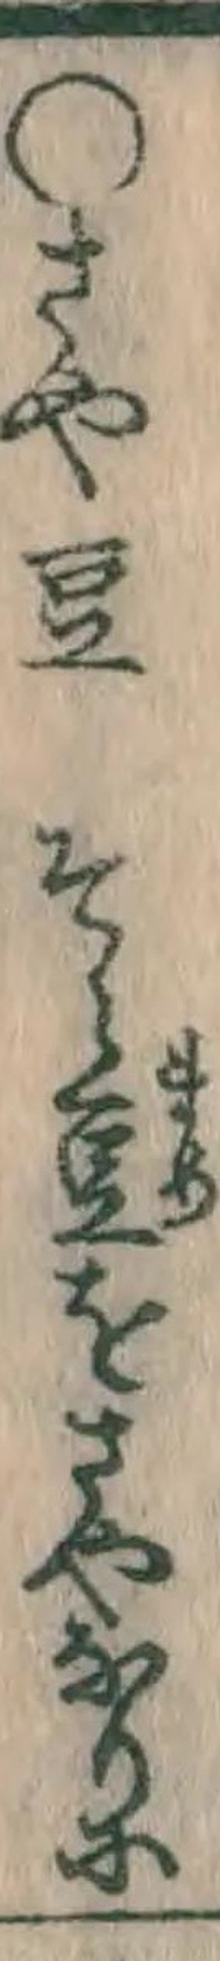○さや豆そら豆をさやなりに
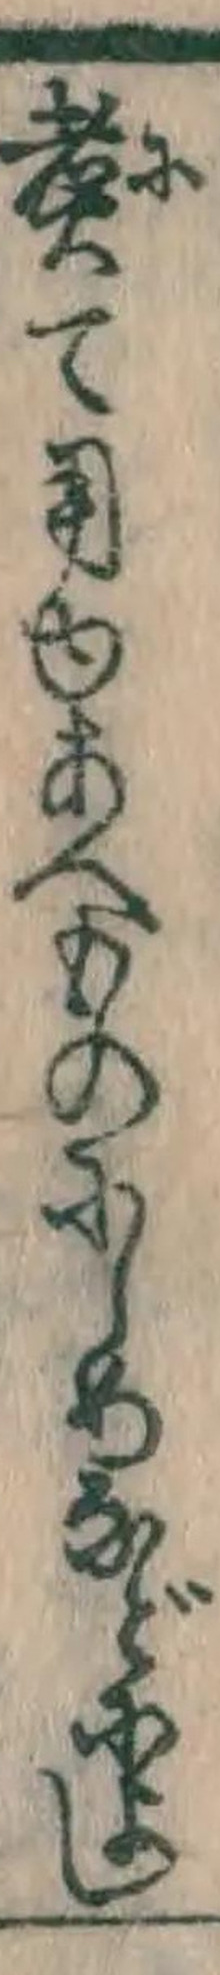煮て用ゆあへものにしめなどによし
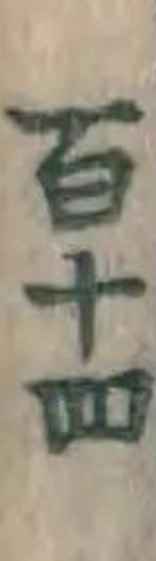百十四

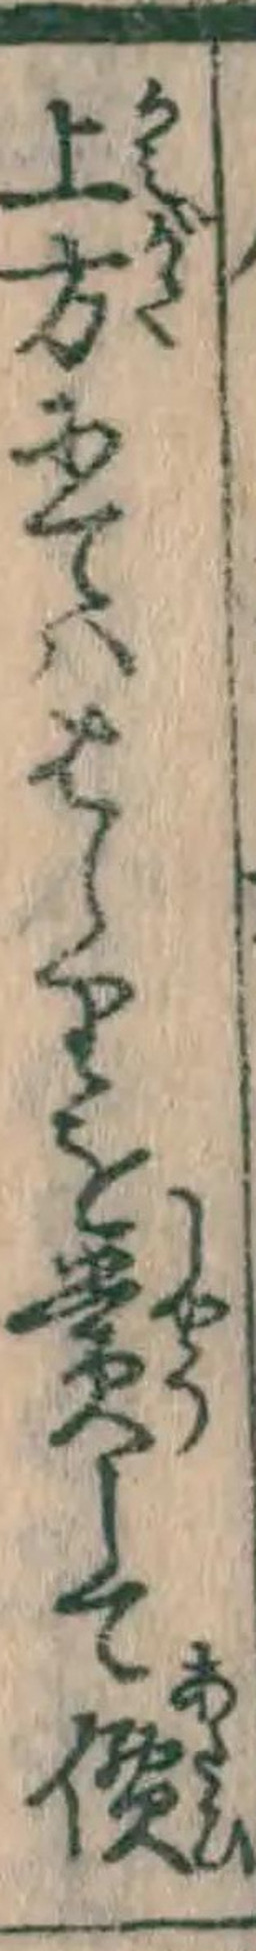上方にてははしりを賞して價
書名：広益秘事大全 3巻. [5]
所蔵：国立国会図書館 National Diet Library, JAPAN
